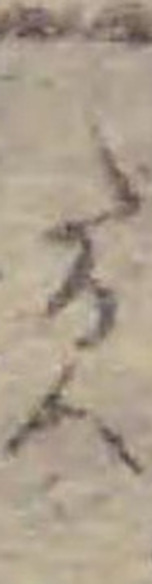たる人
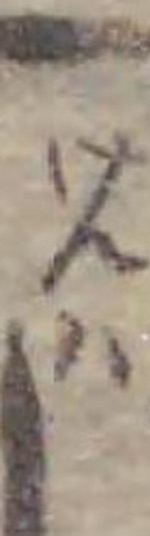けんは
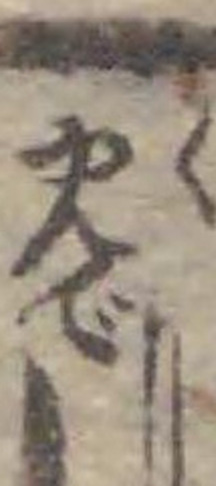やんで
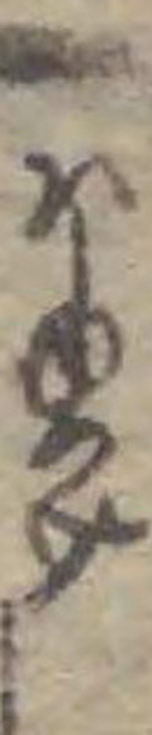はしゆかけ
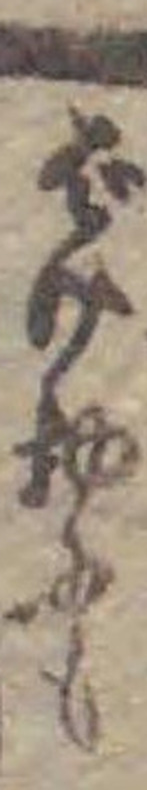ばけ物にも
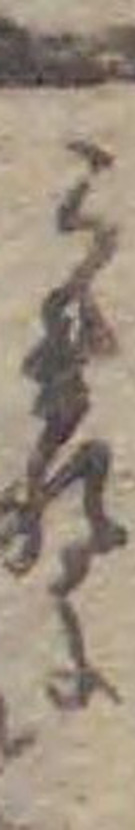うまれよと
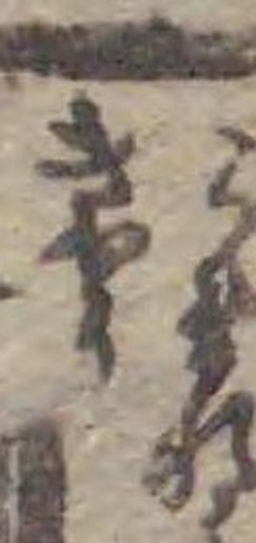きやう
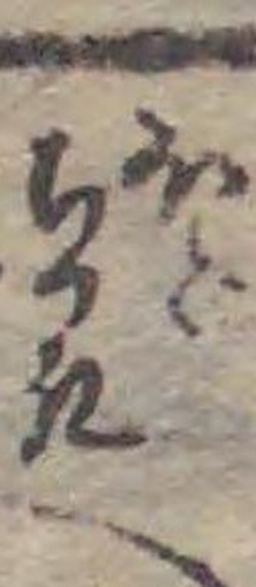ちかき
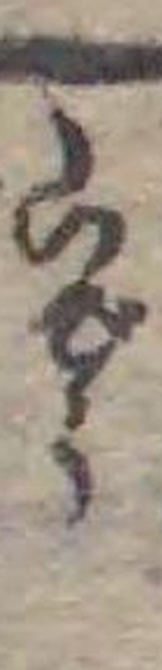きやう
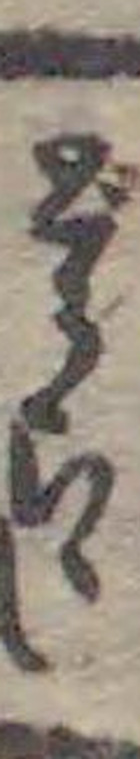どうらくし
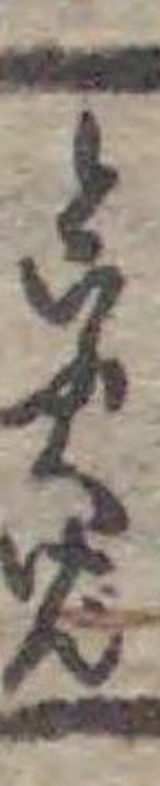といふ人げん
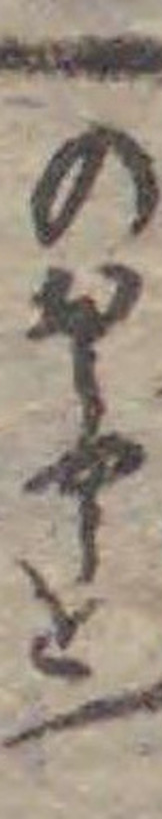のおしやうを
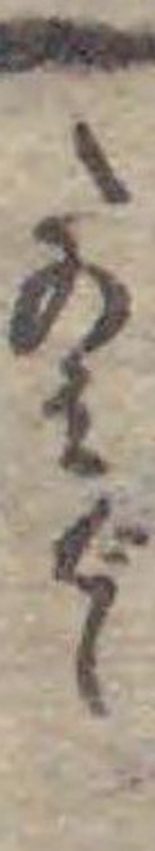たのみでし
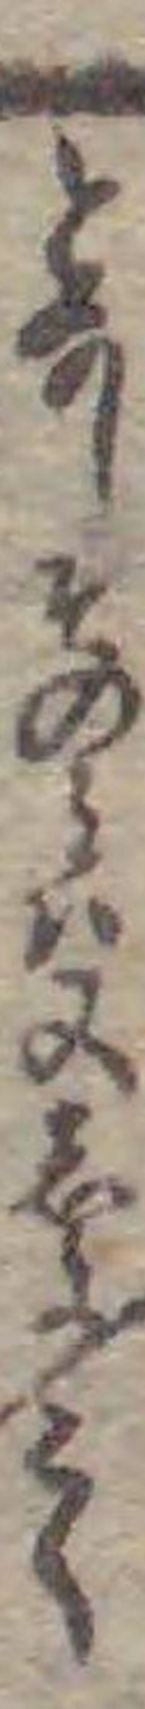となしそのみは又しよこく
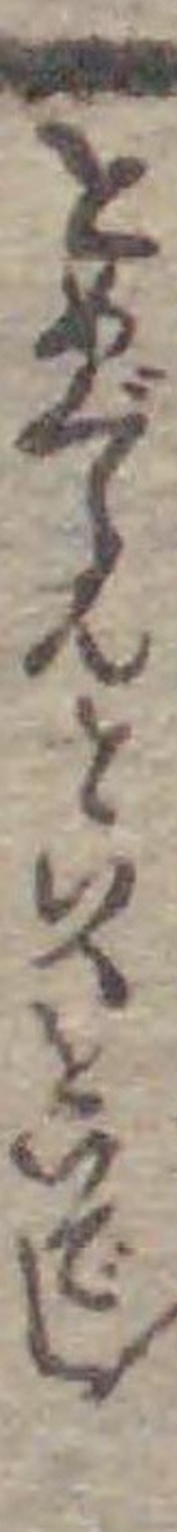とめぐらんといへをいでし
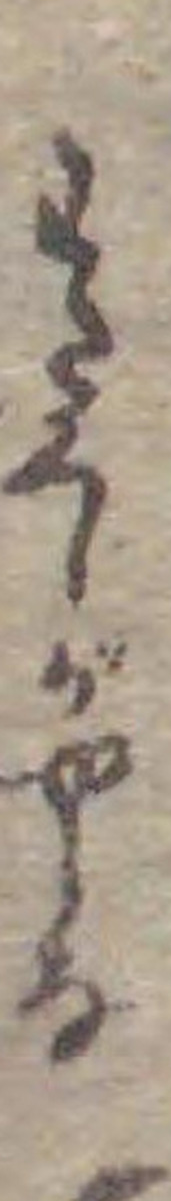わたくしがやうな
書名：[化物一代記] : 5巻
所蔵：国立国会図書館 National Diet Library, JAPAN
